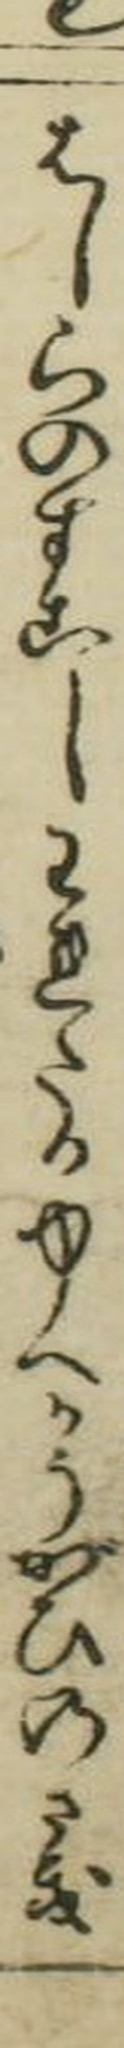はしらのすこしわれたるゆへかうがひのさき
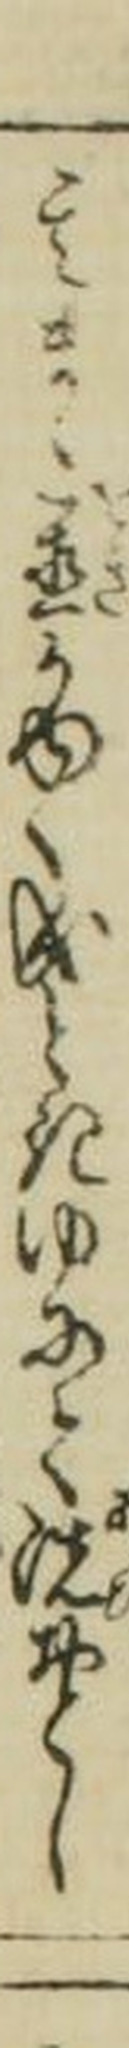其まゝ置かゆく成ときゆにて洗おとし
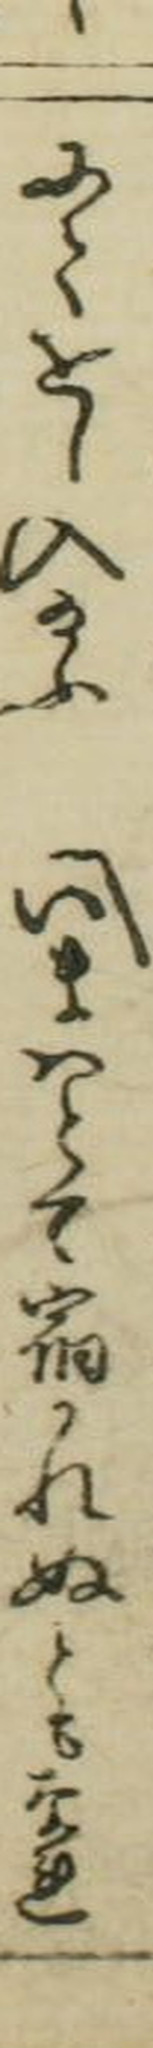にてをし入給ふ〽いまはとて宿かれぬともなれ
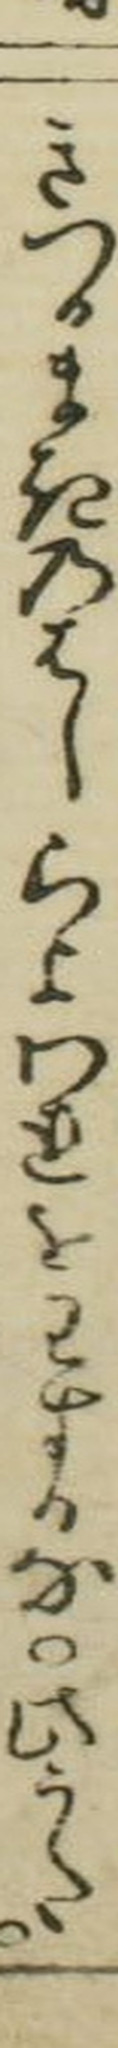きつるまきのはしらよわれをわするな◯此うた
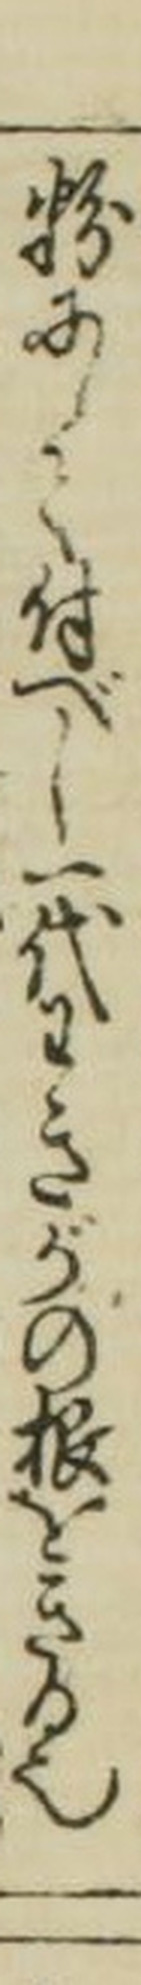粉にして付べし一代わきがの根をきる也
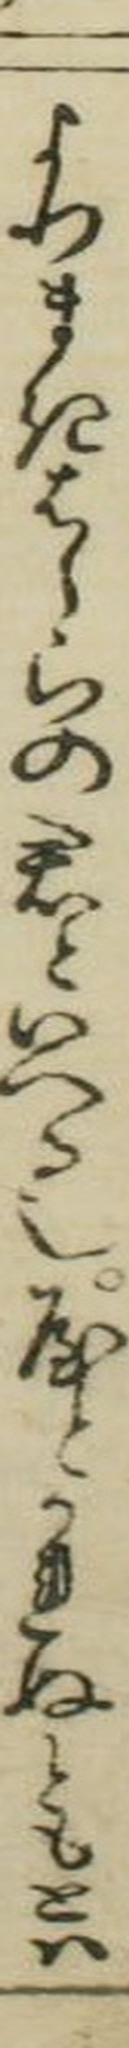よりまきはしらの君といへる也。やとかれぬともとは。
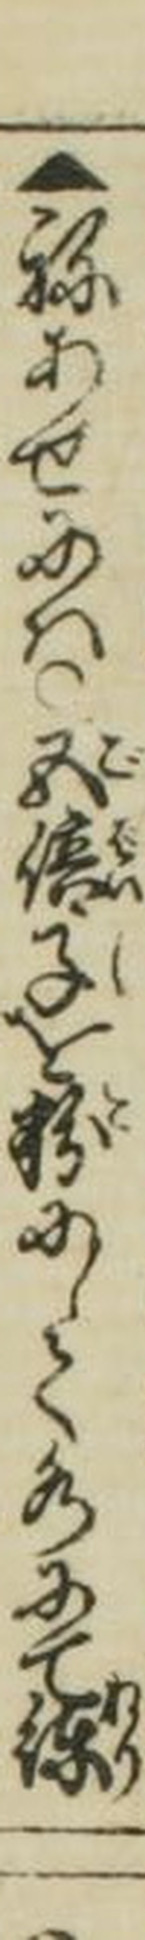▲ねあせには◯五倍子を粉にして水にて練
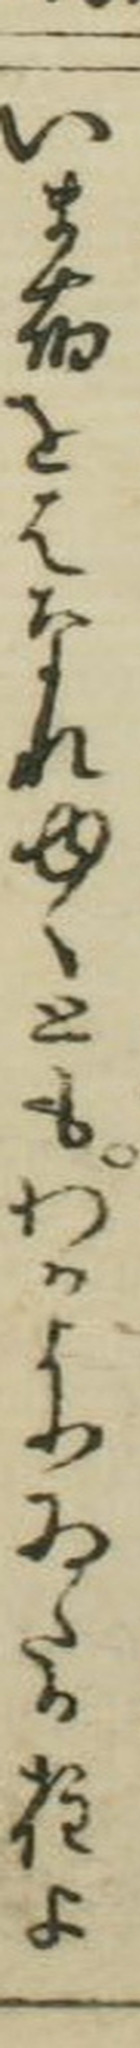いま宿をはなれゆくとも。わかよりゐたる柱よ
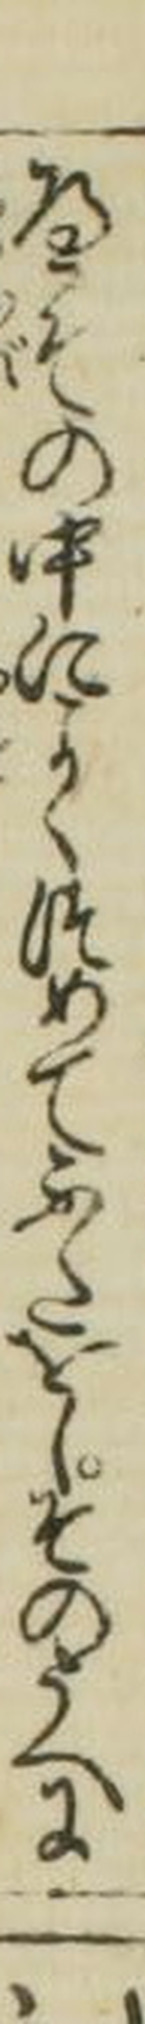へその中によくつめてふたをし。そのうへに
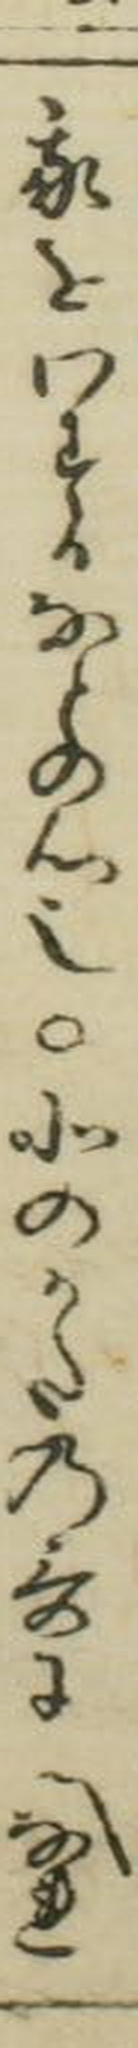我をわすれなとの心也◯北のかたの哥に〽なれ
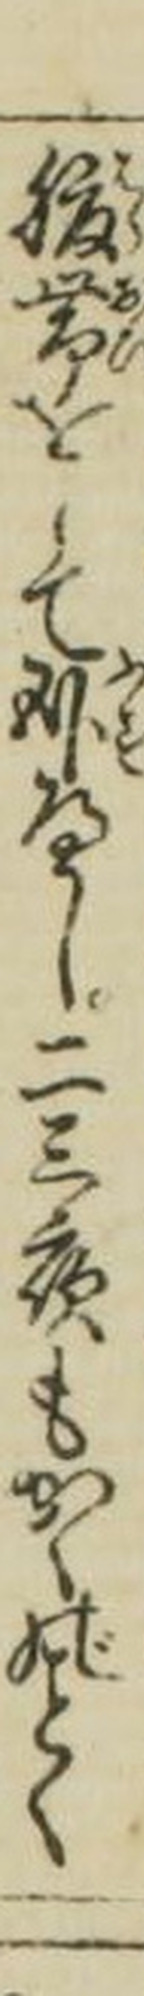腹帯をして臥へし。二三夜もかくのごとく
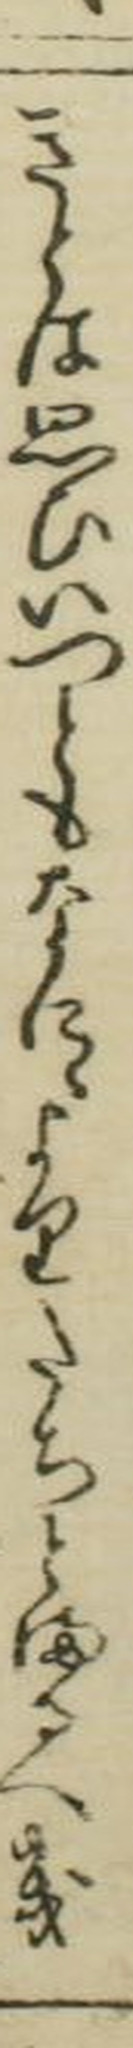きとは思ひいつともなにゝよりたちとまるへき
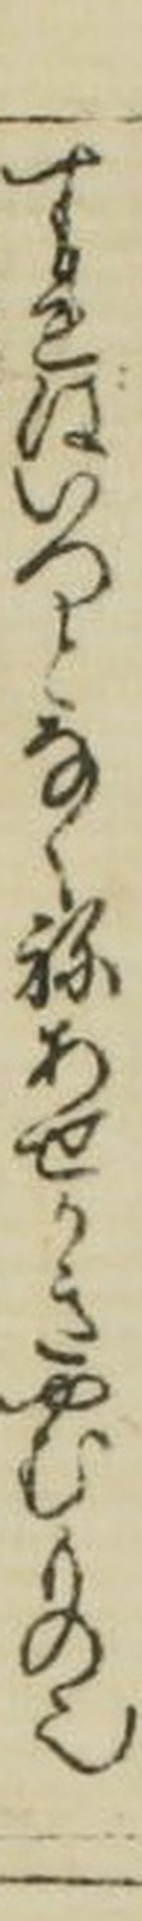すればいつとなくねあせかきやむもの也
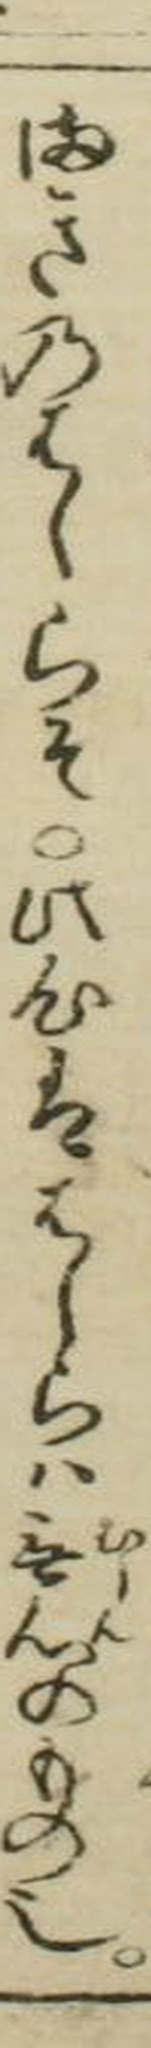まきのはしらそ◯此心ははしらは無心のもの也。
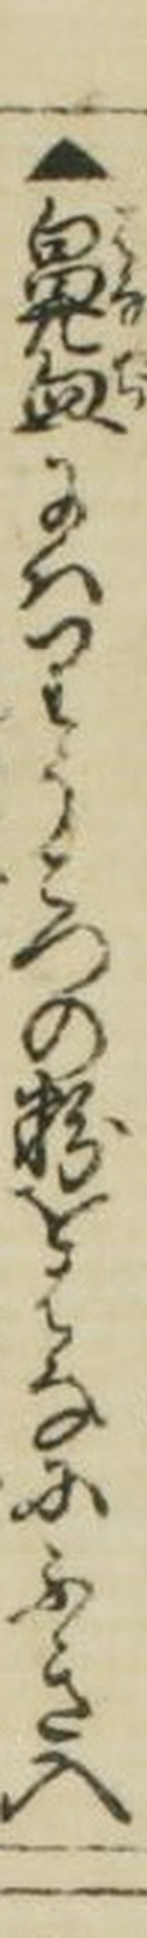▲鼻血にはりうこつの粉をはなにふき入
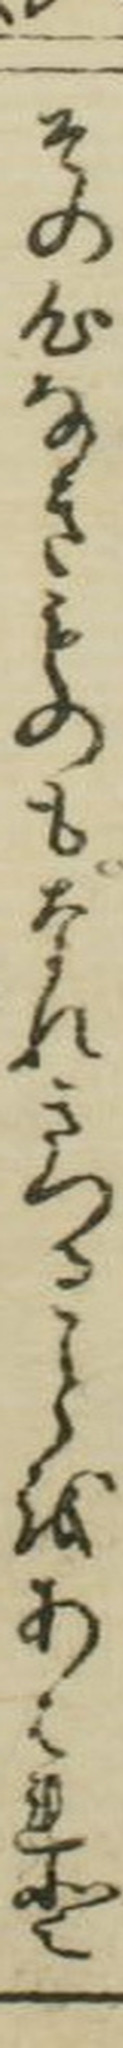その心なきものも。なれきつることをあはれと
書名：女源氏教訓鑑
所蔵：東京学芸大学附属図書館
